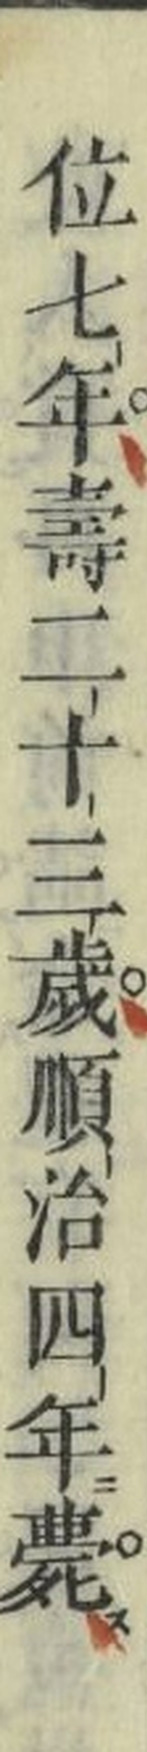位七-年。寿二-十-三-歳。順-治四-年薨。
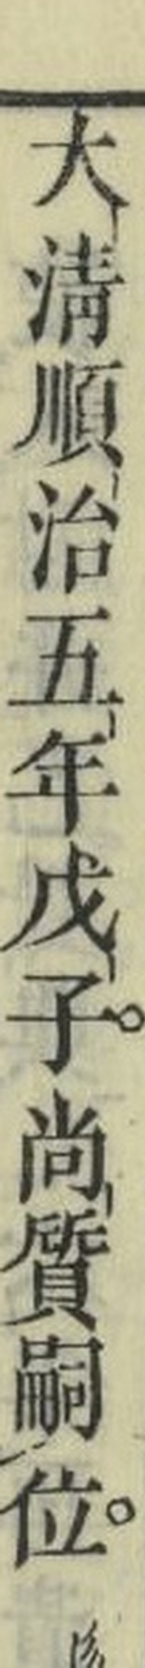大-清順-治五-年戌-子。尚-質嗣位。

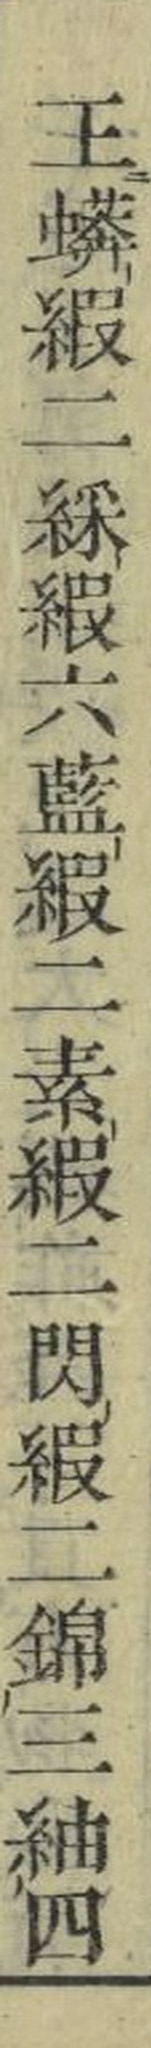王蟒-緞二綵-緞六藍-緞二素-緞二閃-緞二錦-三紬-四
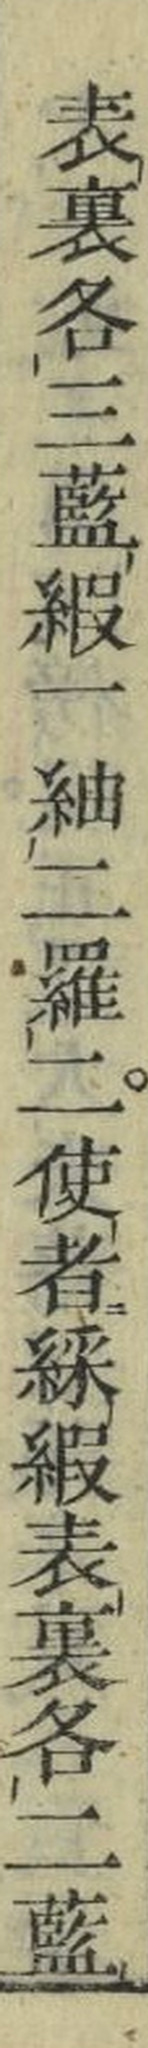表-裏各-三藍-緞一紬-二羅-二。使-者綵-緞表-裏各-二藍-
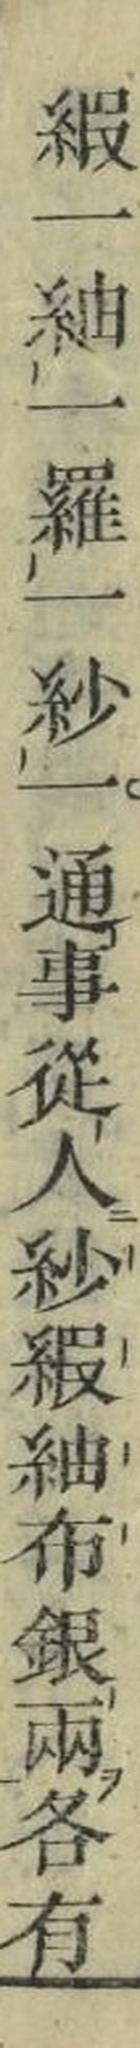緞一紬-一羅-一紗-一。通-事従-人紗緞紬布銀-両各有

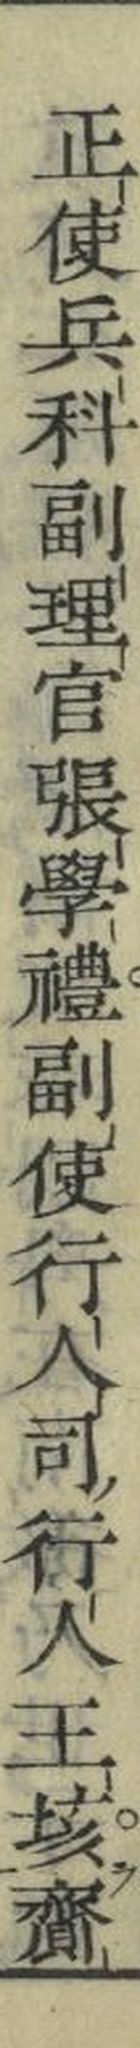正-使兵-科副-理-官張-学-礼。副-使行-人-司行-人王-垓。齎-
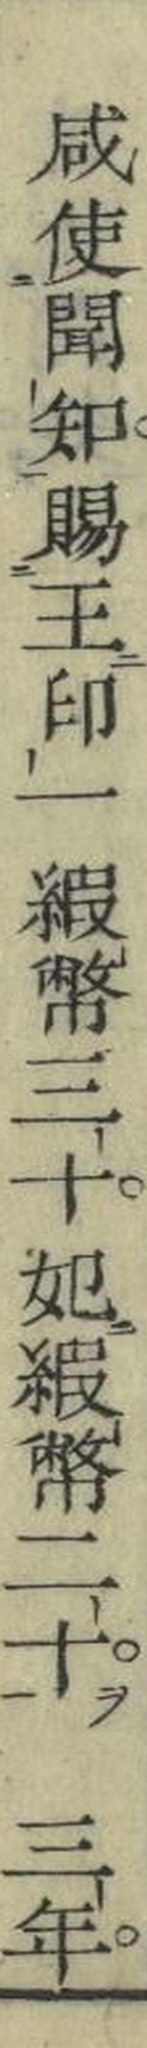咸使聞-知。賜王印-一緞-幣三-十。妃緞-幣二-十。三-年。
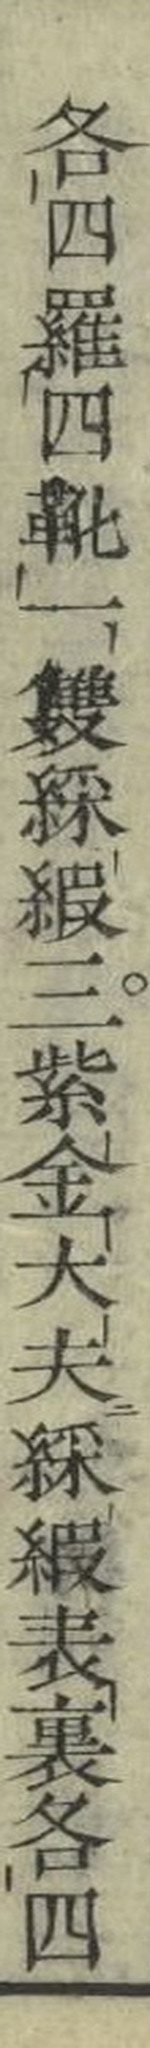各-四羅-四靴-一-双綵-緞三。紫-金-大-夫綵-緞表-裏各-四
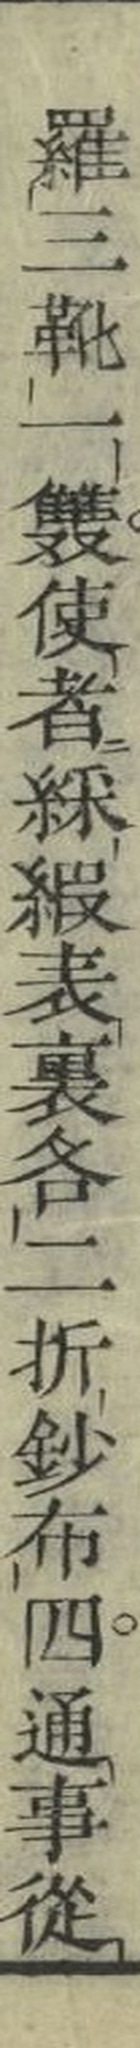羅-三靴-一-双。使-者綵-緞表-裏各-二折-鈔布-四。通-事従-

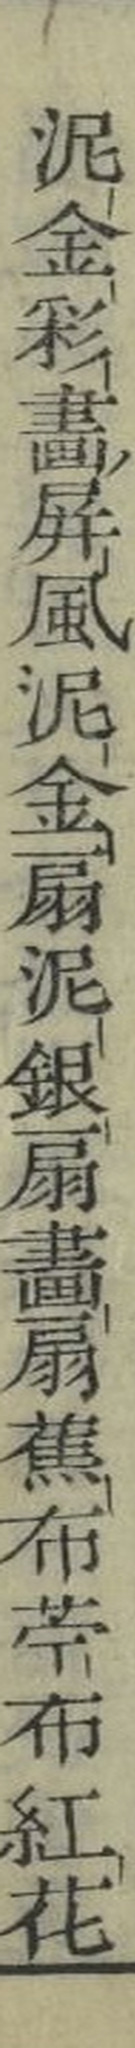泥-金-彩-画屏-風泥-金-扇泥-銀-扇画-扇蕉-布苧-布紅-花

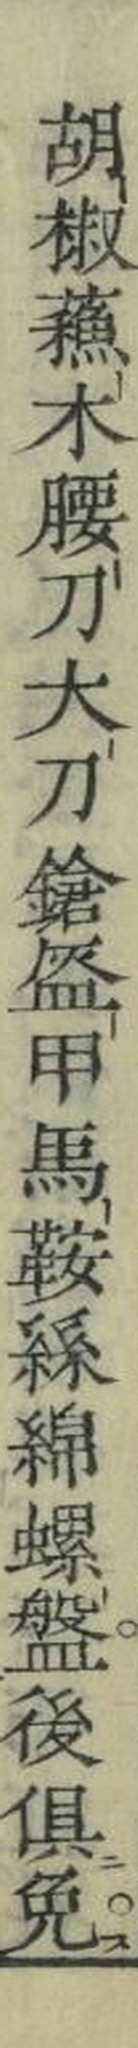胡-椒蘇-木腰-刀大-刀鎗盔-甲馬-鞍糸綿螺-盤。後俱免。
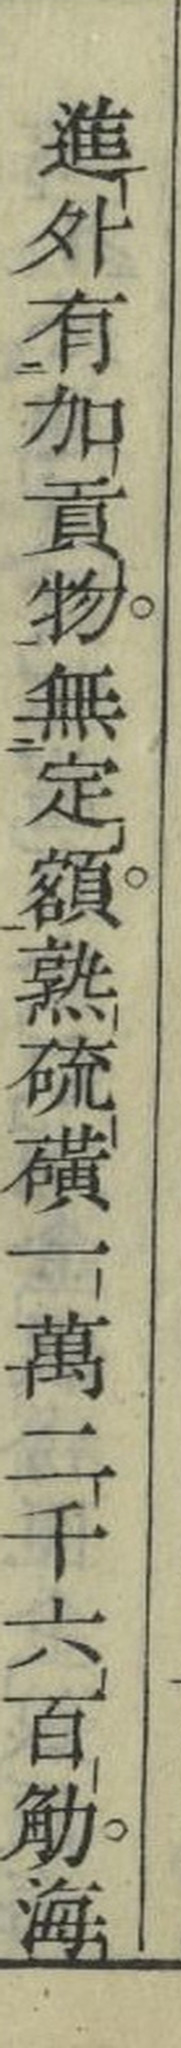進-外有加-貢-物。無定-額。熟-硫-磺一-万二-千六-百-觔。海-

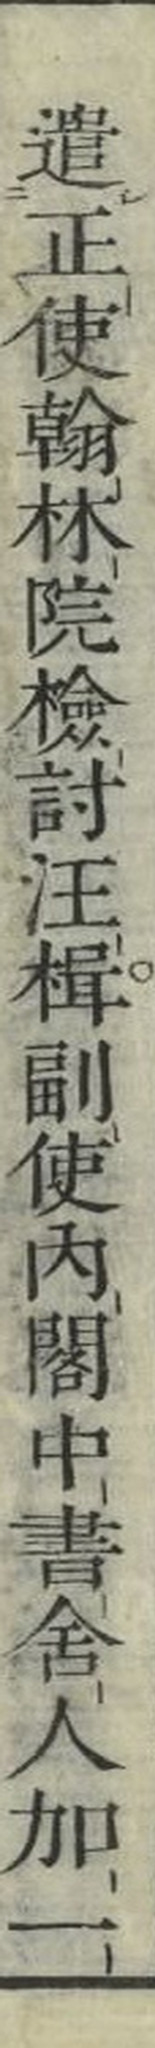遣正-使翰-林-院検-討汪-楫。副-使内-閣中-書-舎-人加-一-

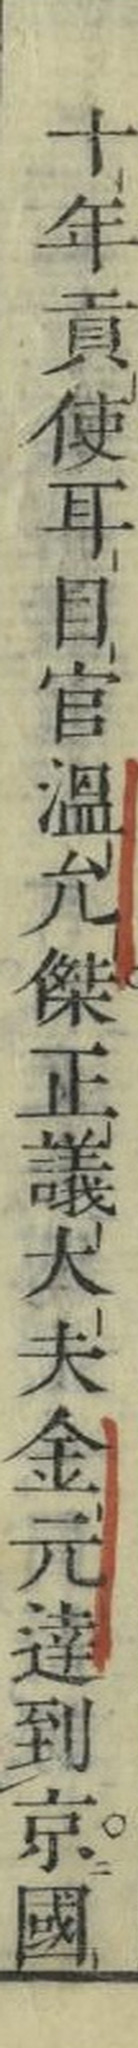十-年。貢-使耳-目-官温-允-傑。正-議-大-夫金-元-達到京。国-
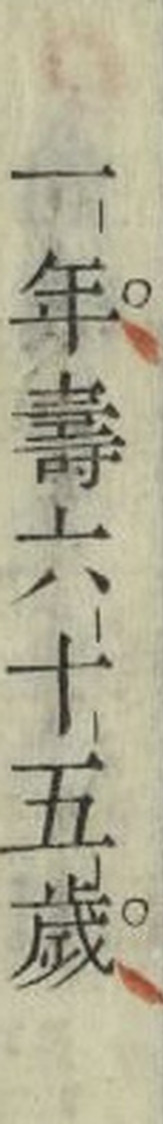一-年。寿六-十-五-歳。
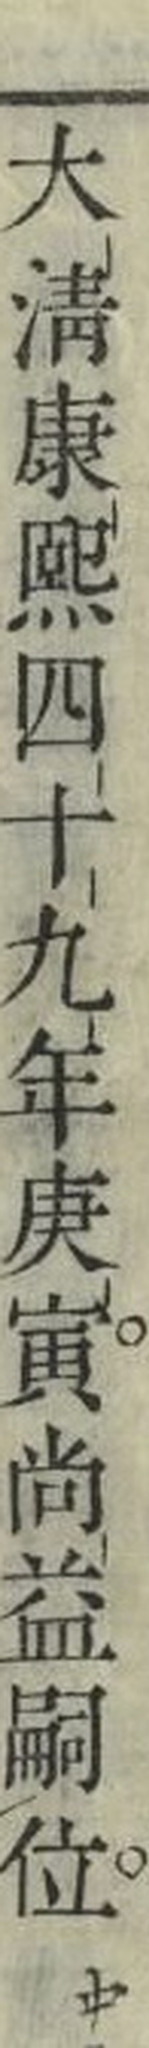大-清康-煕四-十-九-年庚-寅。尚-益嗣位。
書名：中山伝信録 巻三
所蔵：University of the Ryukyus Library
